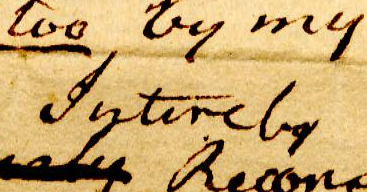Intirely
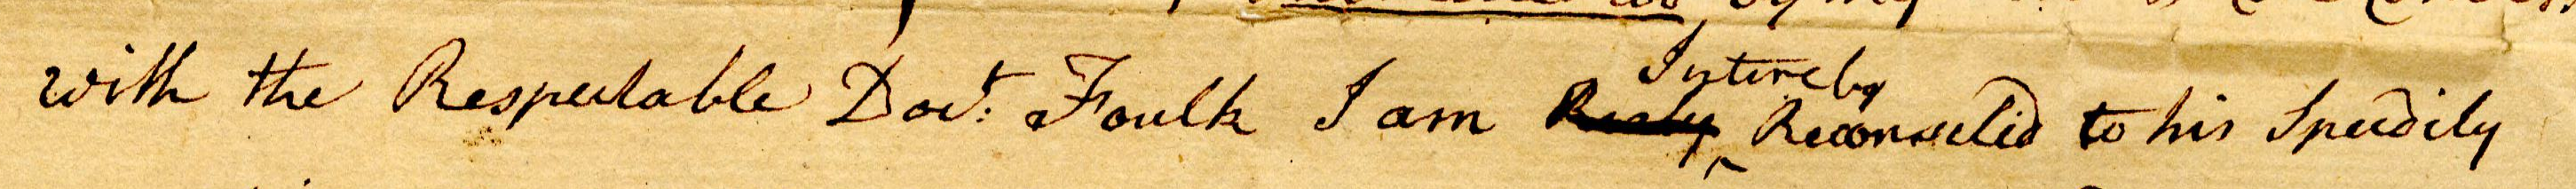with the Respectable Doc^t: Foulk I am [Ready] ^ Reconselid to his speedily
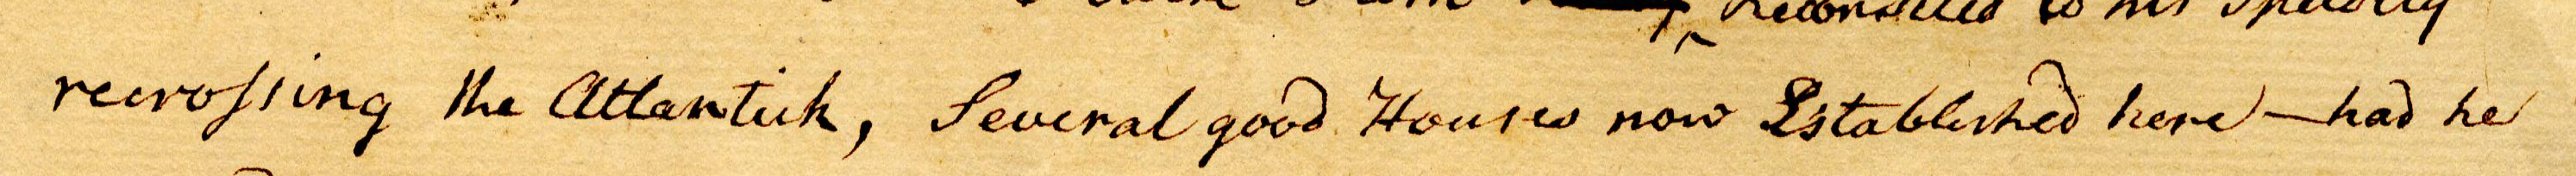recrossing the Atlantick, several good Houres now Established here- had he
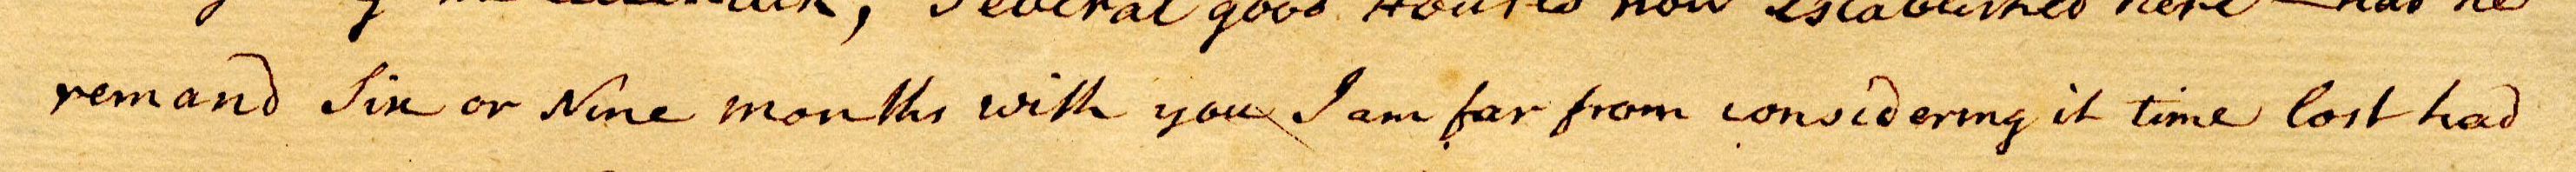remand Six or Nine months with you I am far from considering it time lost had
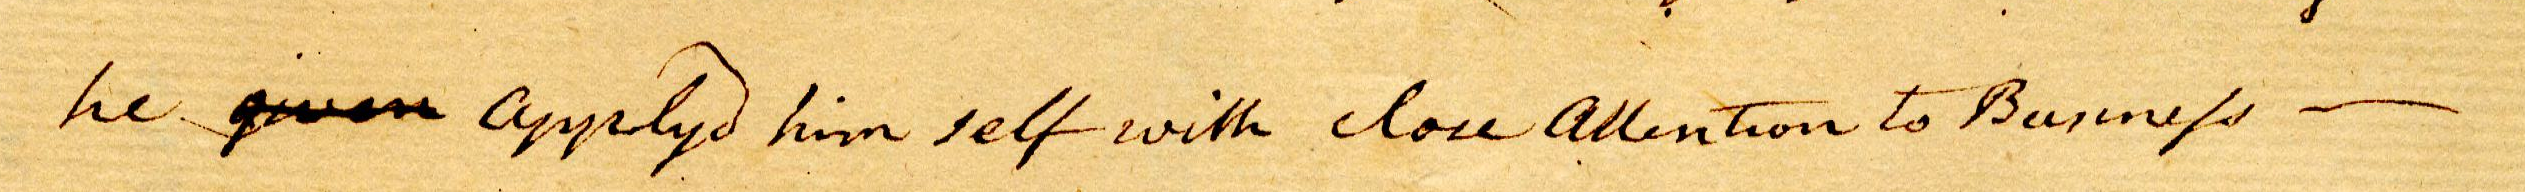he [given] applyd him self with close Attention to Business-
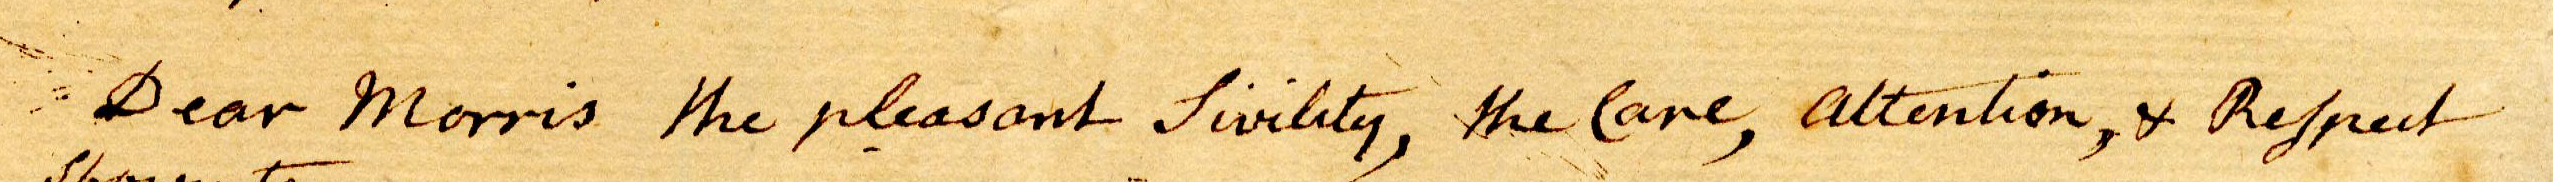Dear Morris the pleasant Sivility, the Care, Attention, & Respect
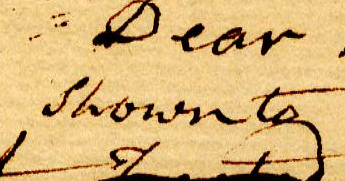shown to
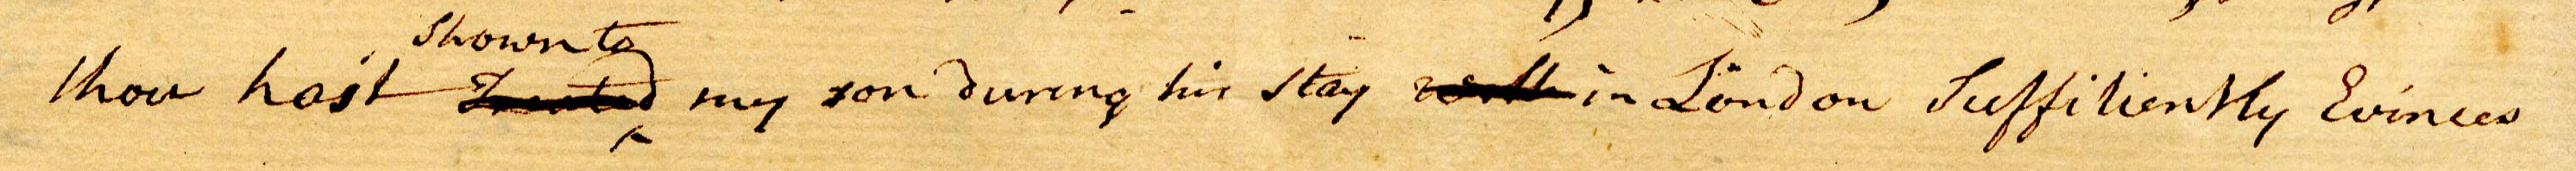thou hast [Treated] ^ my son during his stay [will] in London suffitiently Evinces
